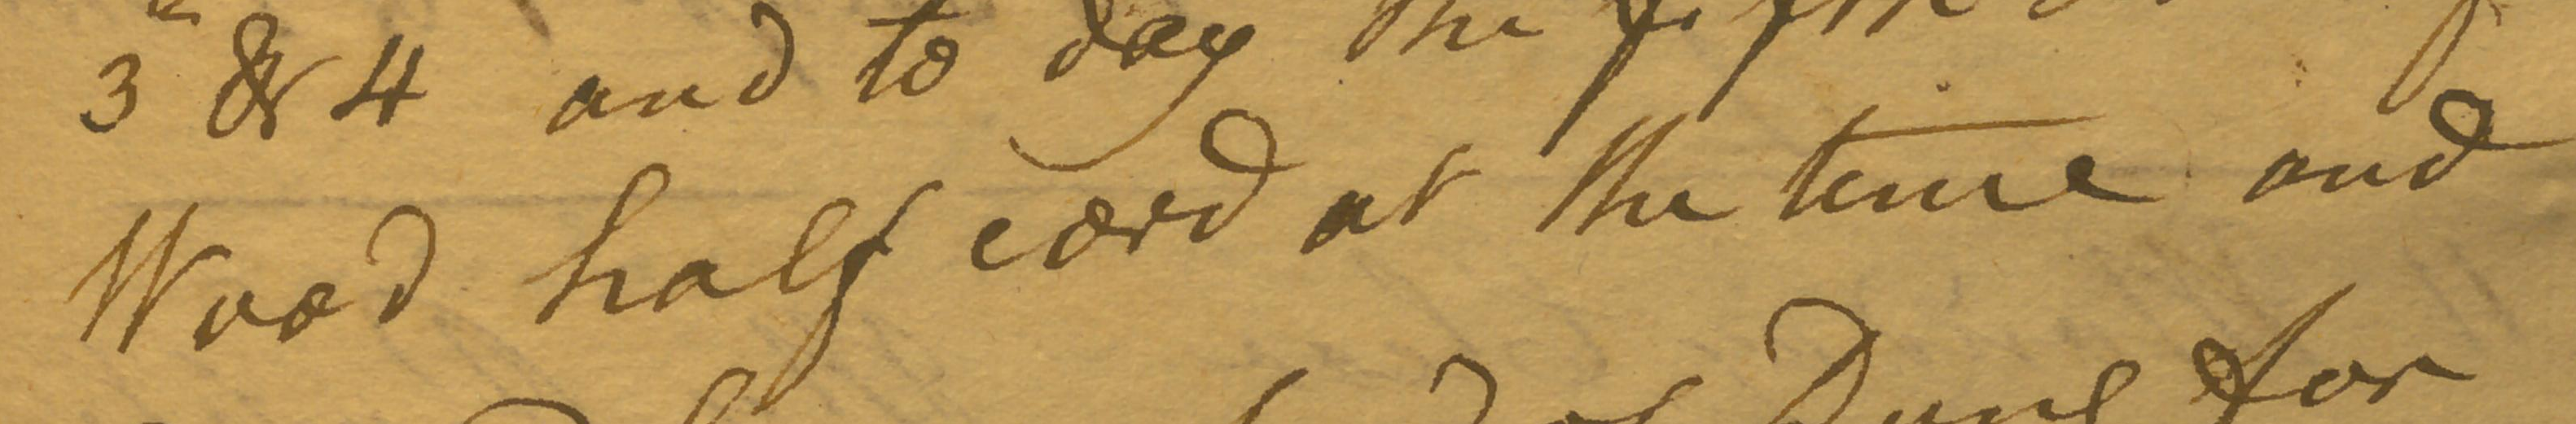Wood half cord at the time, and
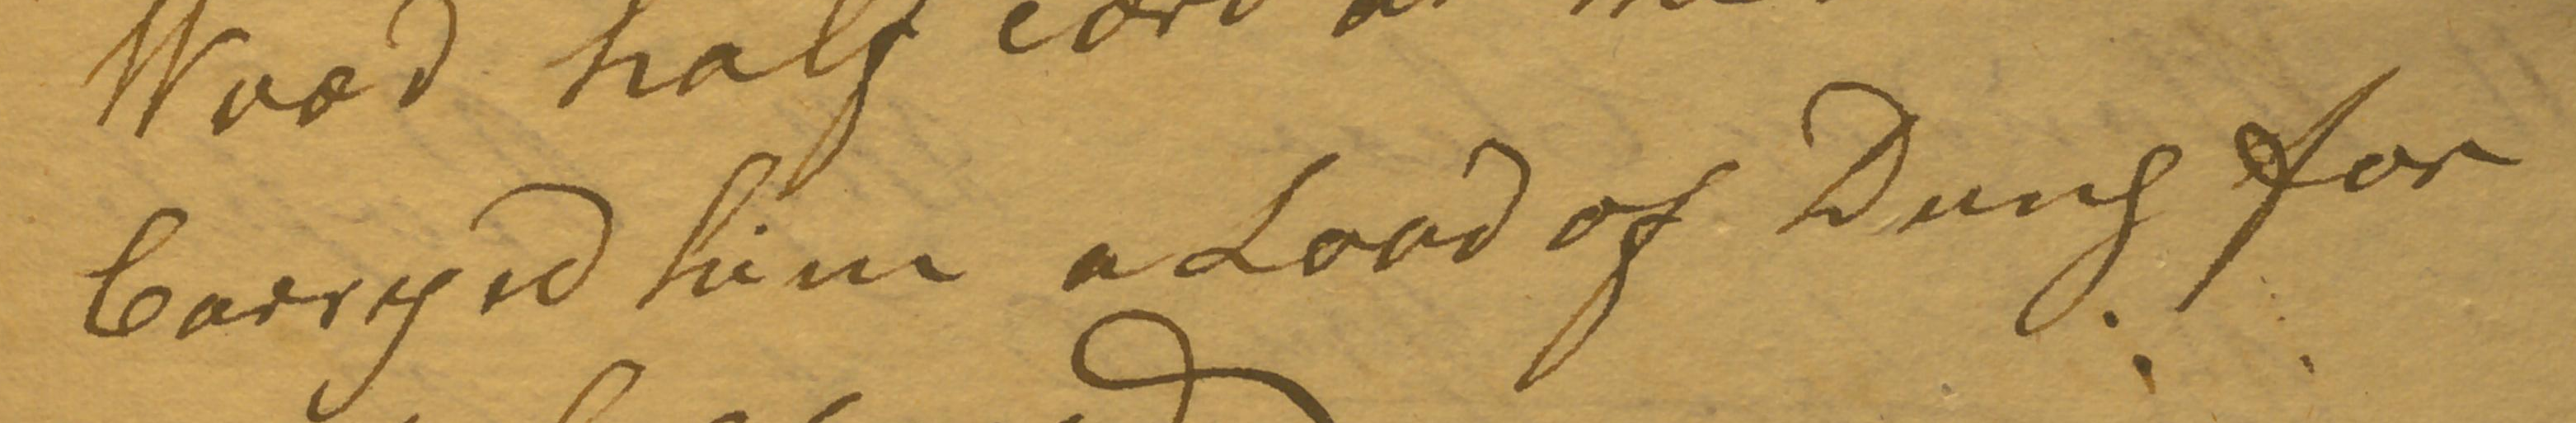Carryed him a Load of Dung for
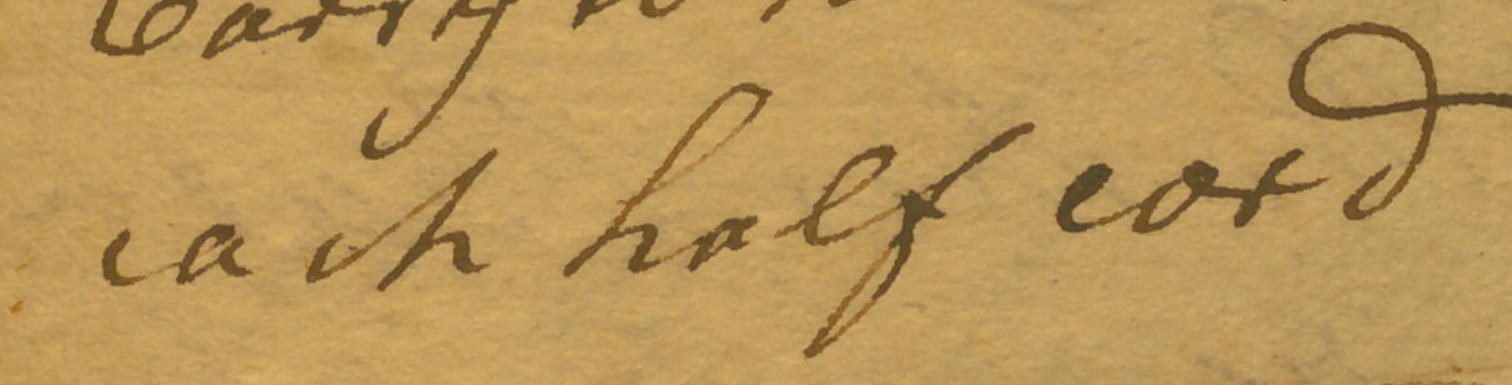each half cord
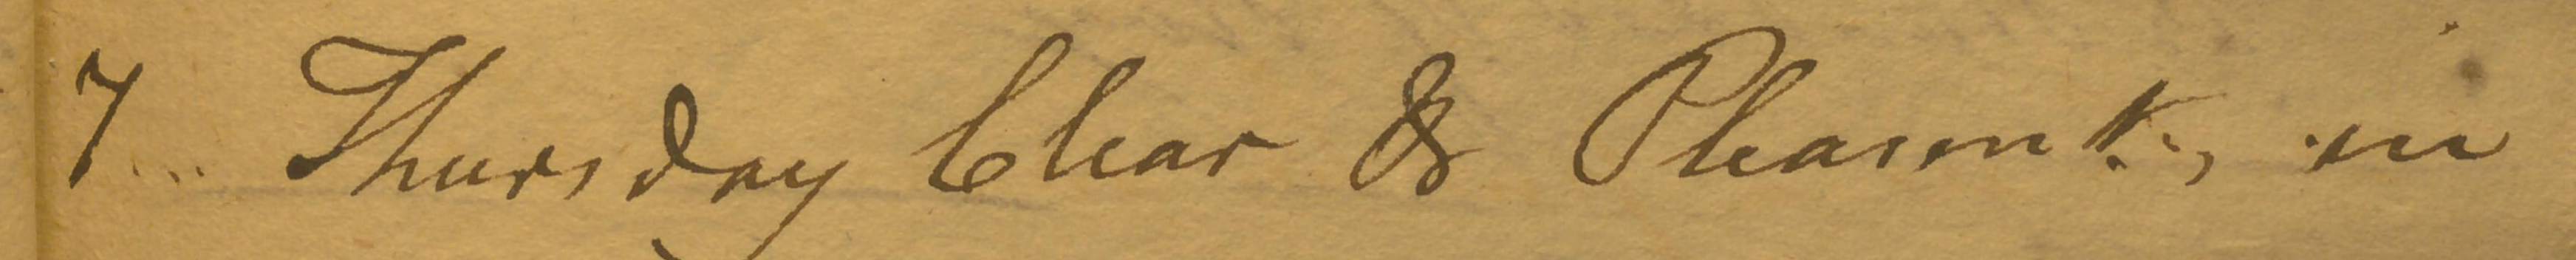7 Thursday Clear & Pleasent, in
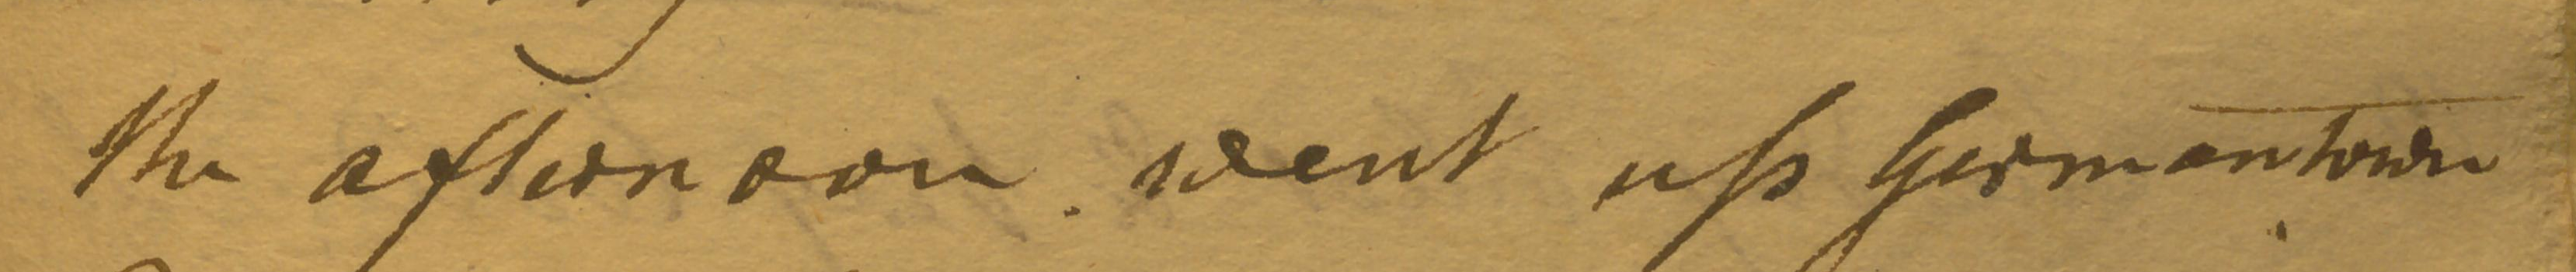the afternoon. went up Germantown
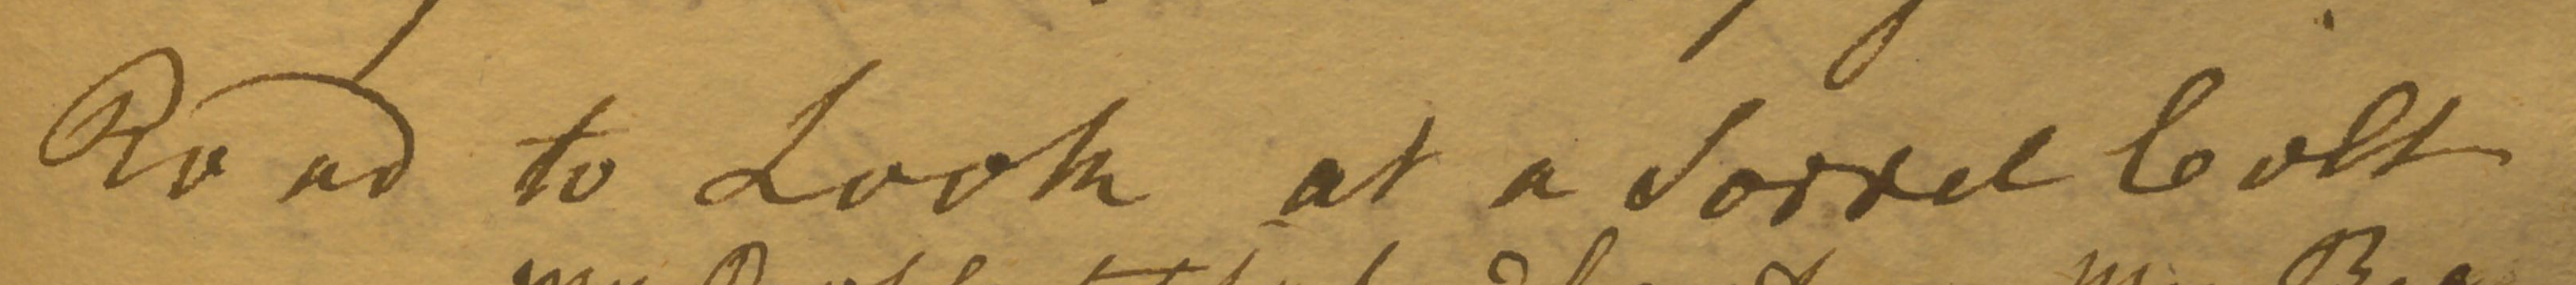Road to Look at a sorrel Colt
